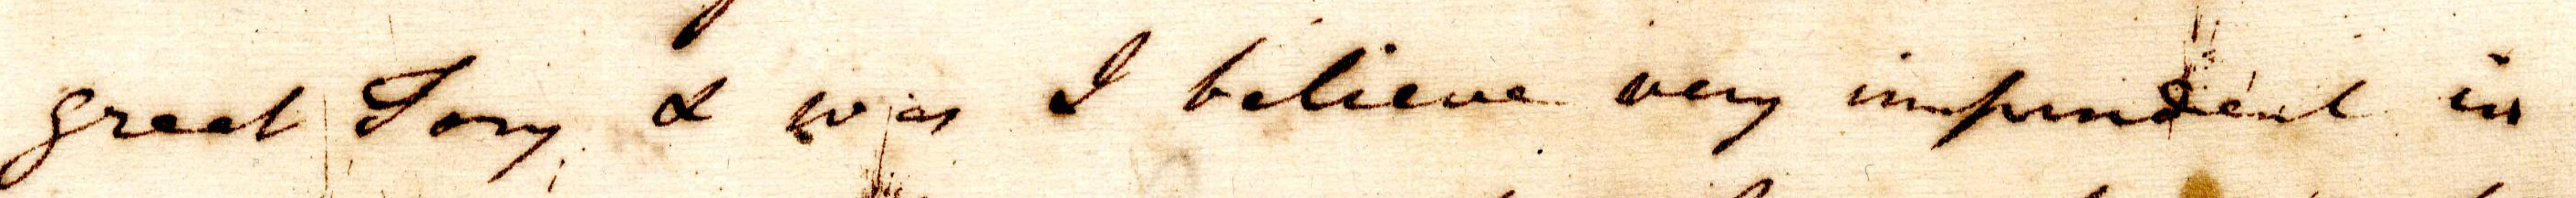great Tory, & was I believe very imprudent in
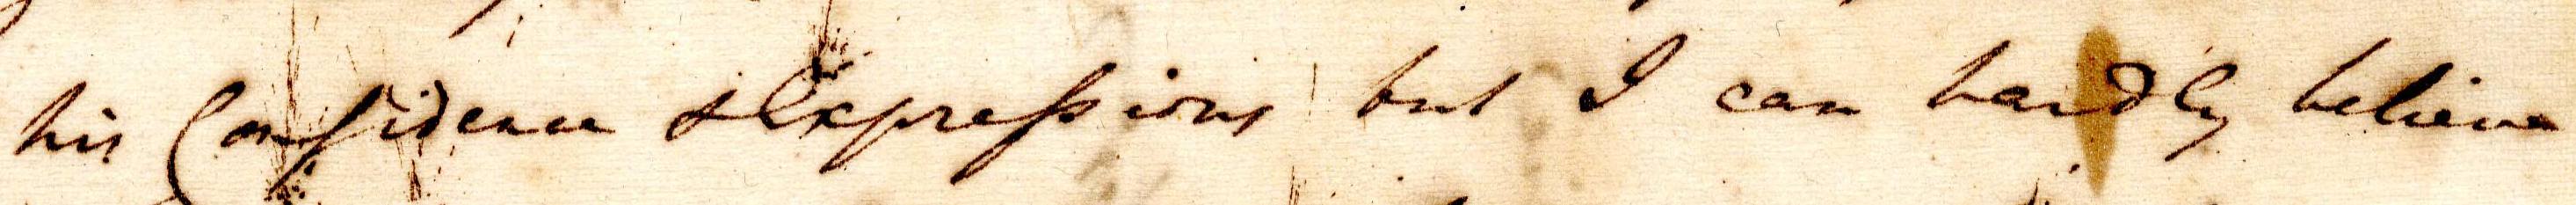his Confidence & Expressions but I can hardly believe
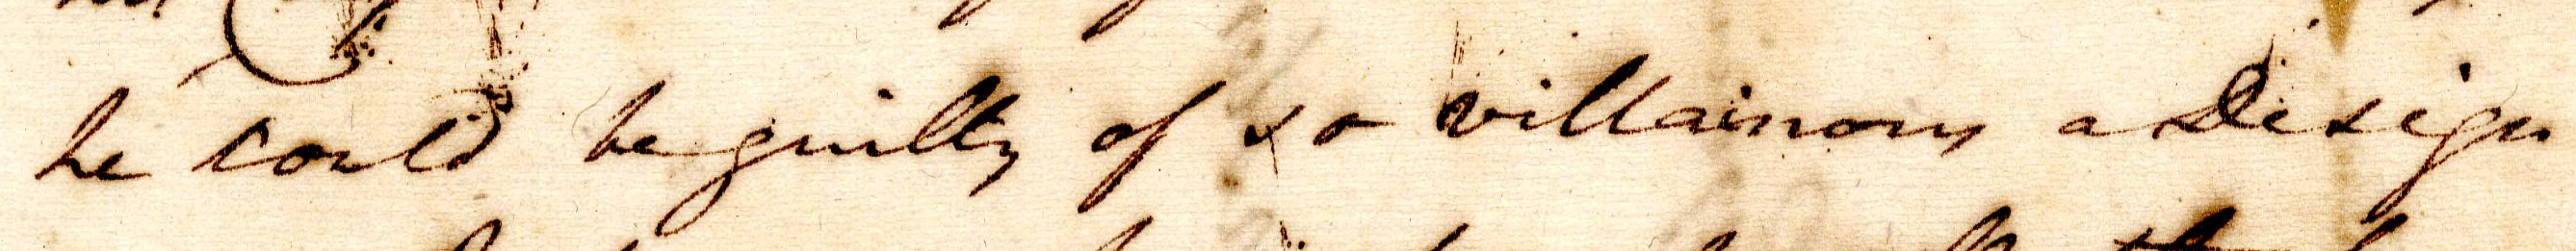he could be guilty of so villainous a design.
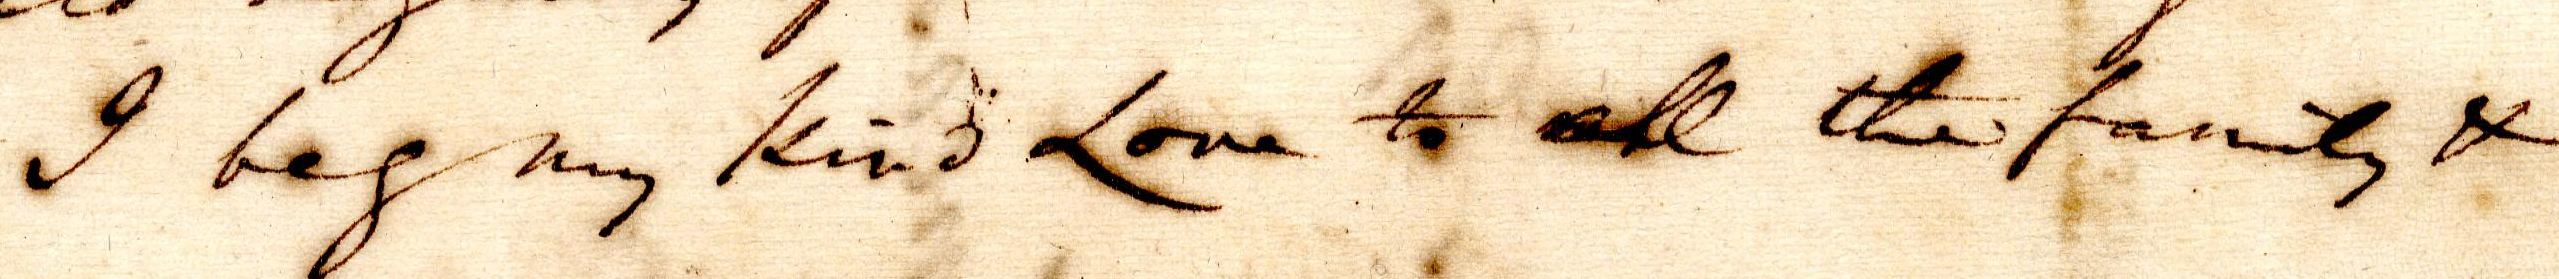I beg my kind Love to all the family &
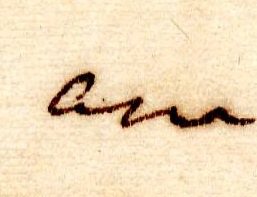am
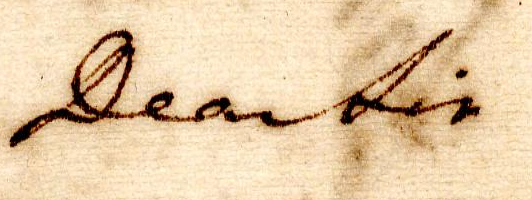Dear Sir
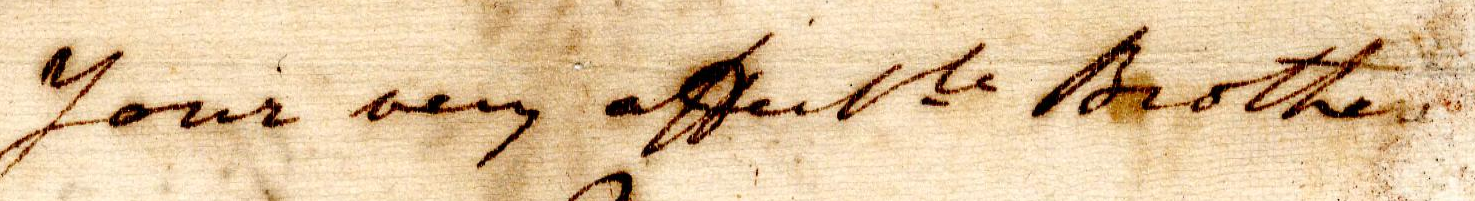Your very affect^te Brother
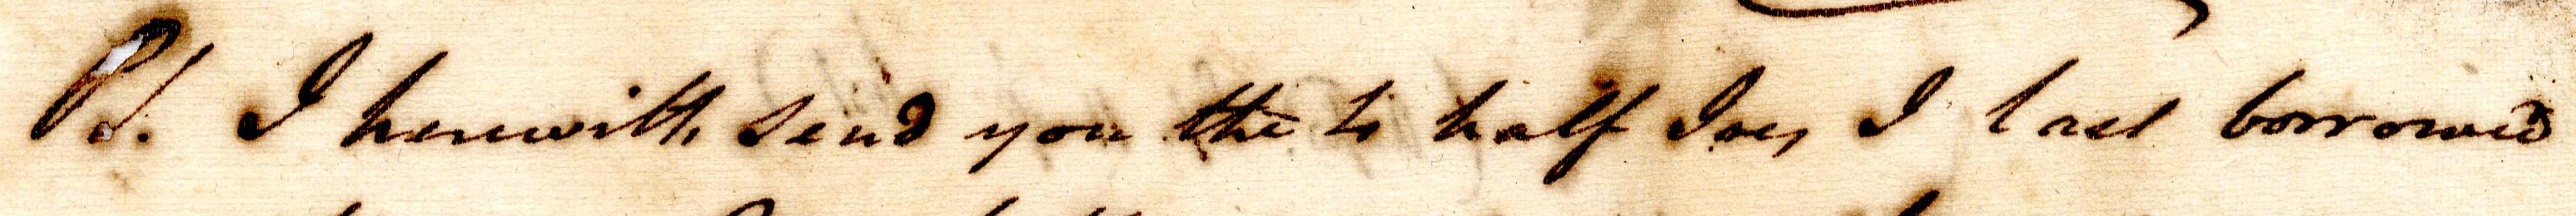PS. I herewith send you the to half Joes I last borrowed
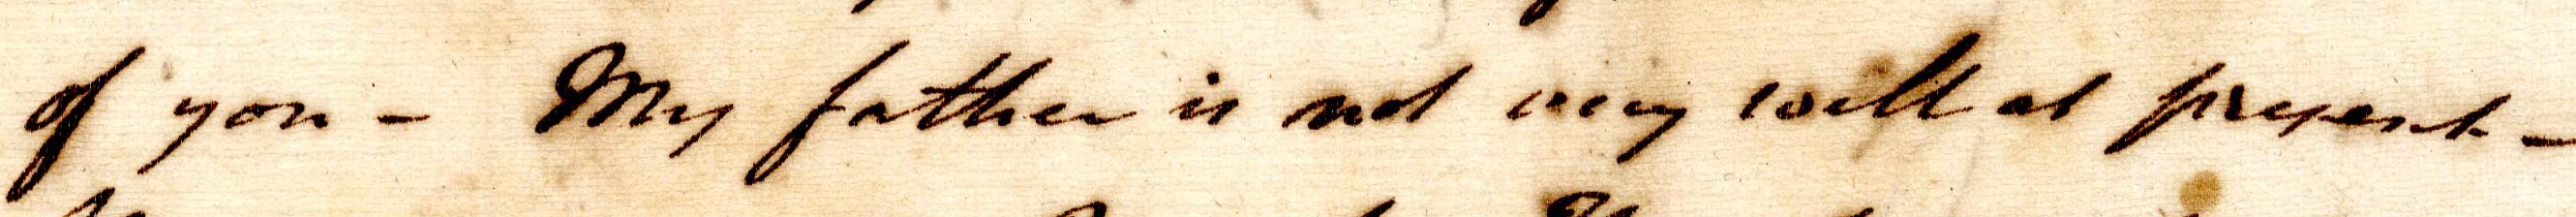of you- My father is not very well as present-
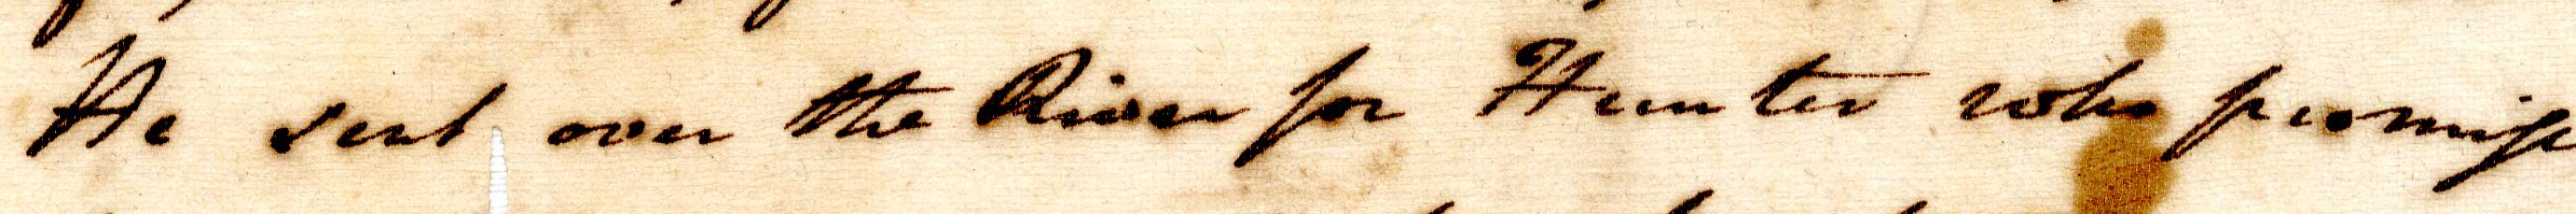He sent over the River for Hunter who promised
